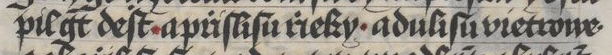pil ḡt deẛt.a pṙiẛli ſu ṙieky.a duli ſu víetrowe.
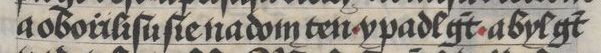a oboṙili ſu ſie na dom ten.y padl ḡt.a byl ḡt
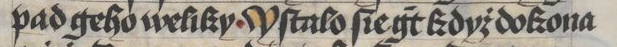pad geho weliky.Yſtalo ſie ḡt když dokona
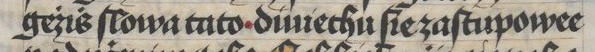geżiṡ ſlowa tato.díuiechu ſie zaſtupowee
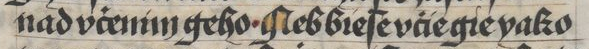nad vċením geho.Neb bíeẛe vċíe gie yako
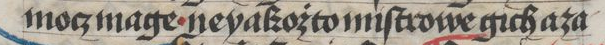mocz mage.neyakożto miſtrowe gich a za
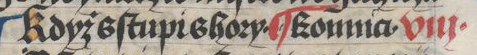Kdyż sſtupi s hory. konnici .viij.
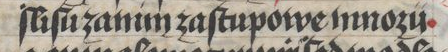ẛli ſu zaním zaſtupowe mnozij.
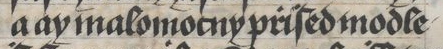a ay malomocny pṙiẛed modle¬
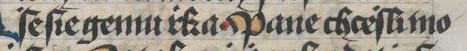ẛe ſie gemu ṙka.Pane chceẛli mo¬
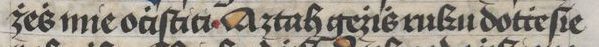žeṡ mie ociſtiti.A ztah geżiṡ ruku dotċe ſie
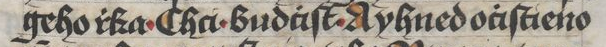geho ṙka.Chci.bud ċiſt.A yhned oċiſtieno¬
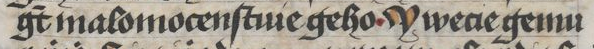ḡt nalomocenſtuíe geho.Y wecie gemu.
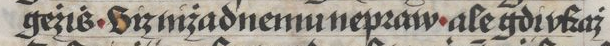geżiṡ.Viz niżadnemu nepraw.ale gdi vkaż
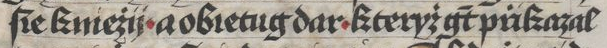ſie knieżij.a obietug dar.kteryż ḡt pṙikazal
